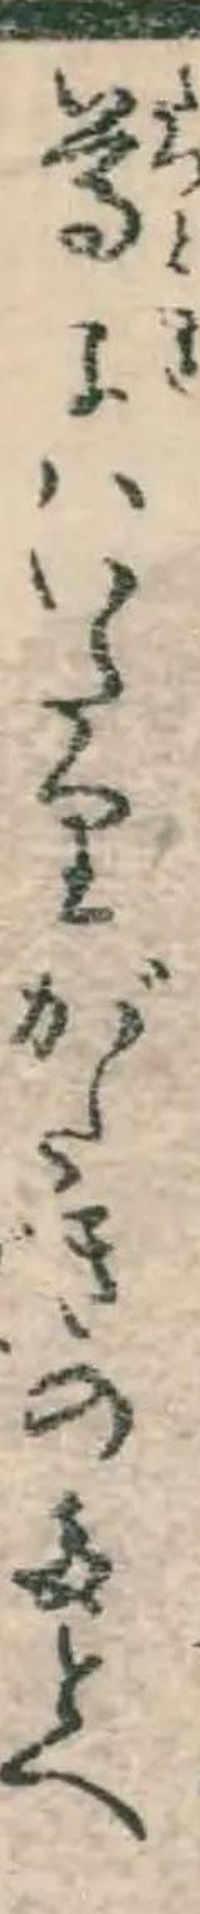尊にはいたりがたきのたとへ
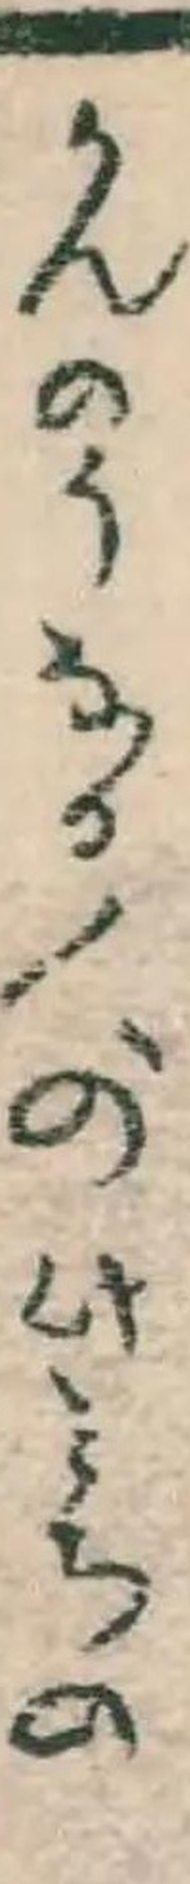かんのうなる人の此みちの
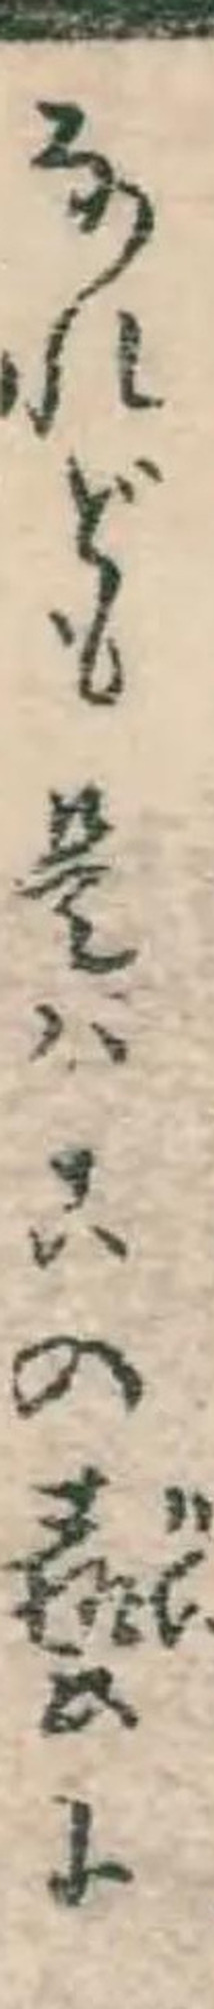なれども是はこの藝に
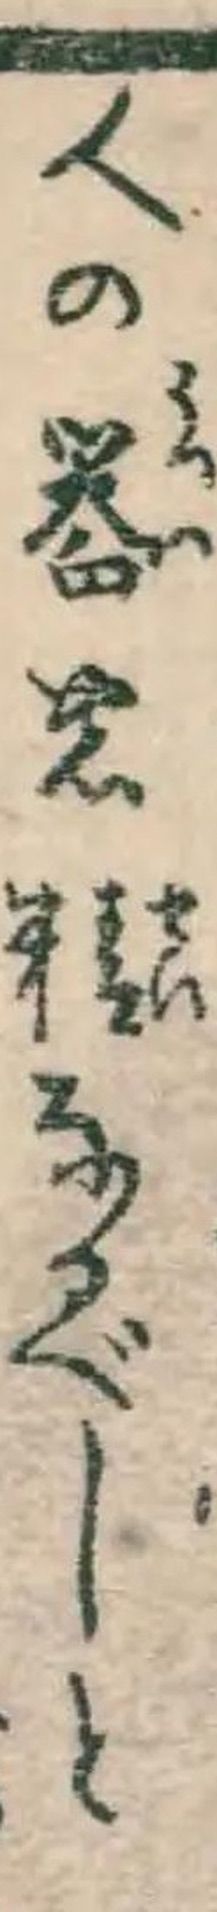人の器の精なるべしと
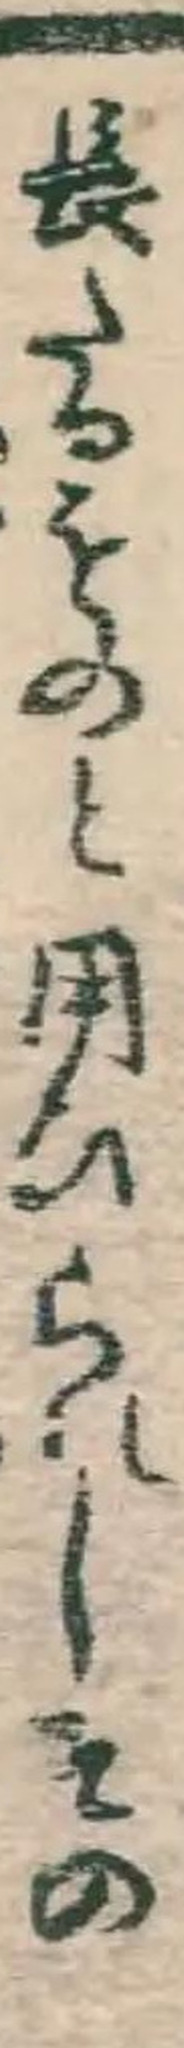長たるものと用ひられしその
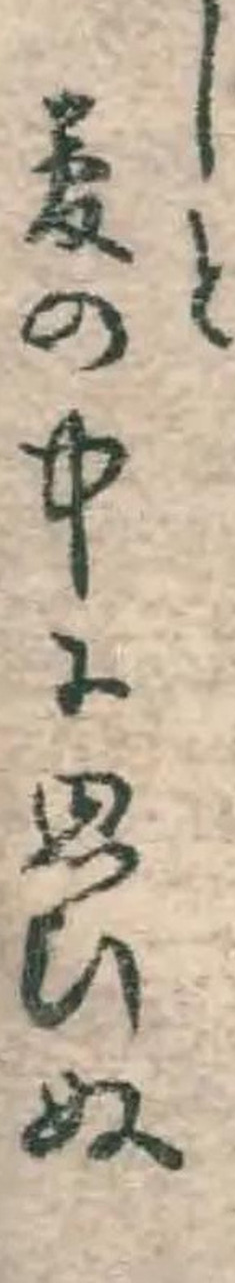夢の中に思ひぬ
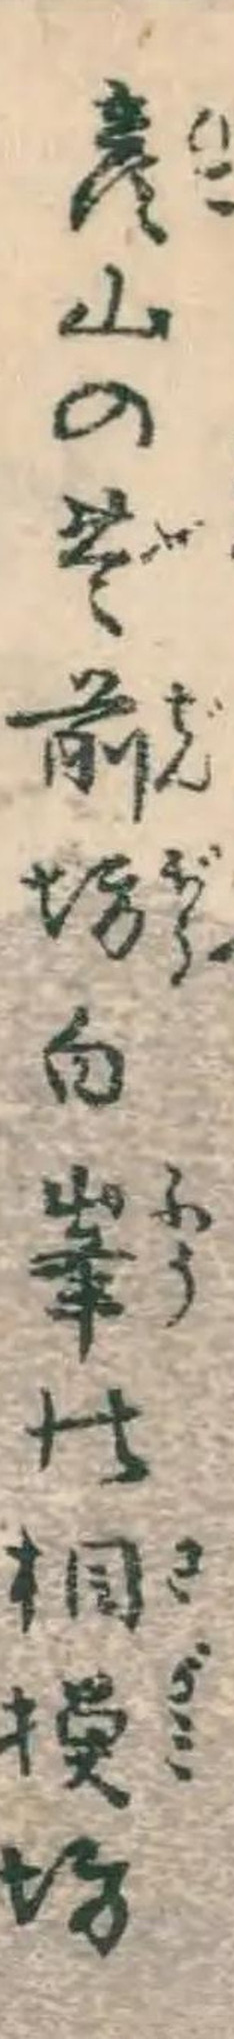彦山の豊前坊白峯の相模坊
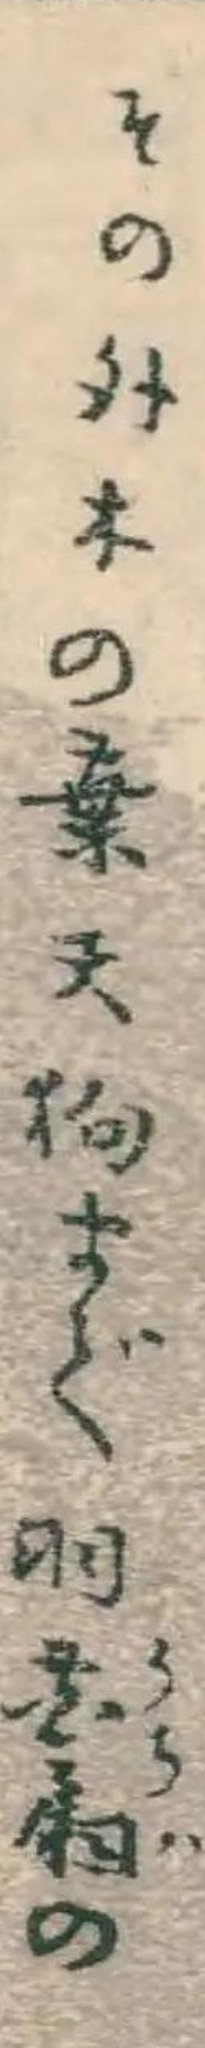その外木の葉天狗まで羽団扇の
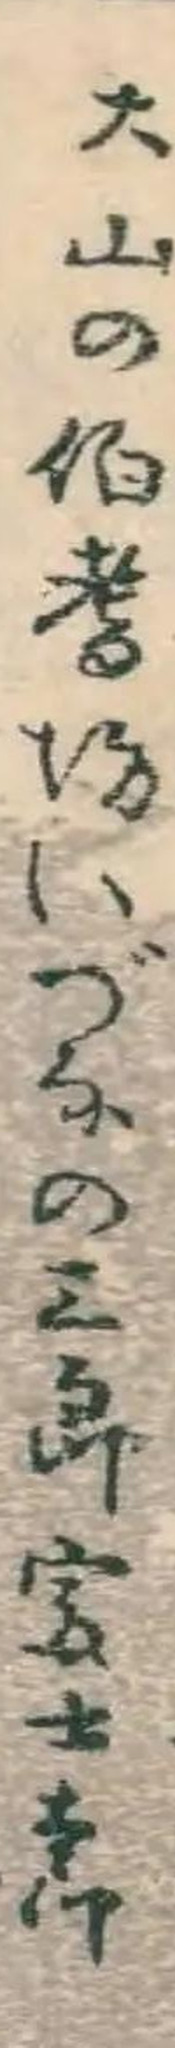大山の伯耆坊いづなの三郎富士太郎
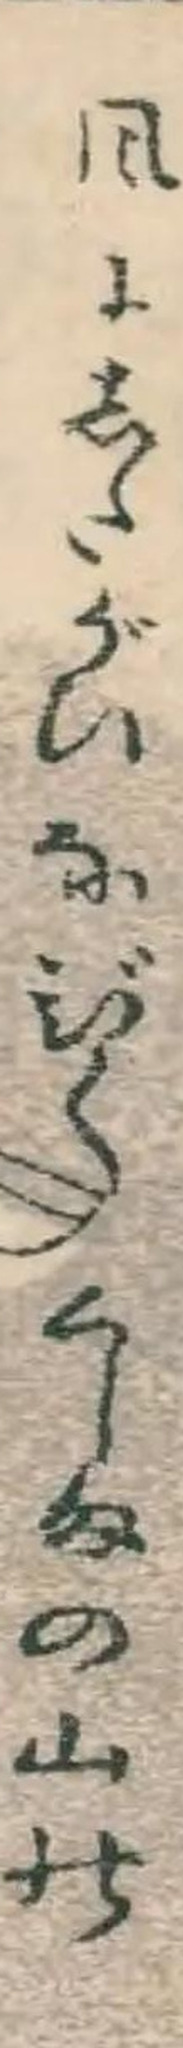風にしたがひなびくくらまの山の
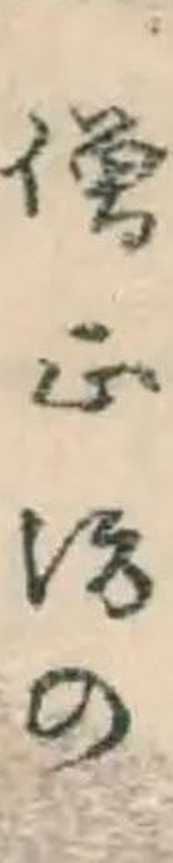僧正坊の
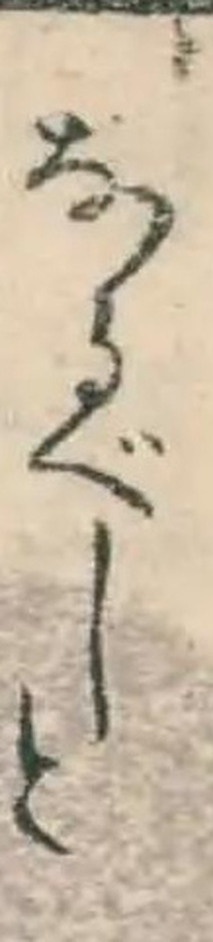なるべしと
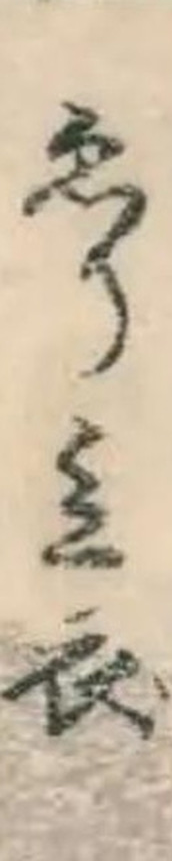ゑり立衣
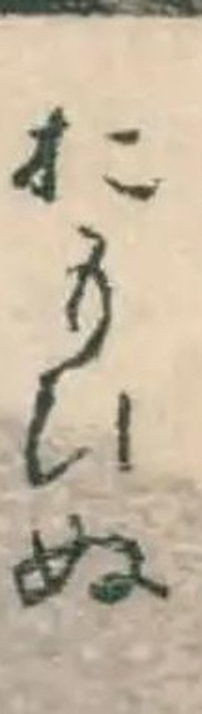おもひぬ
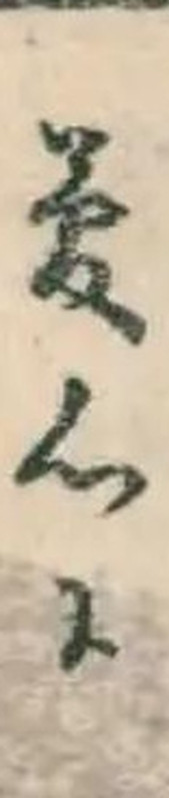夢心に

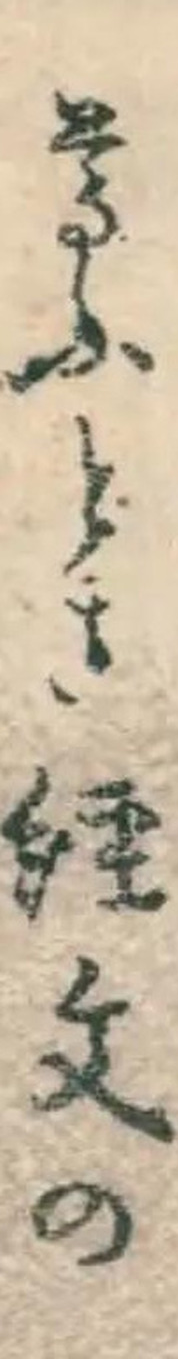尊ふとき経文の
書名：百鬼徒然袋 3巻. [2]
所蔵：国立国会図書館 National Diet Library, JAPAN
